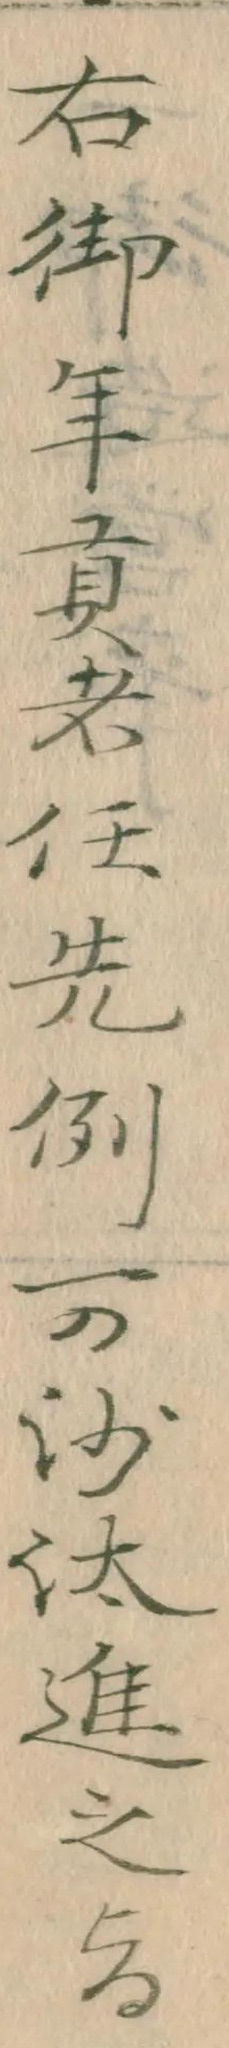右御年貢者任先例可沙汰進之旨
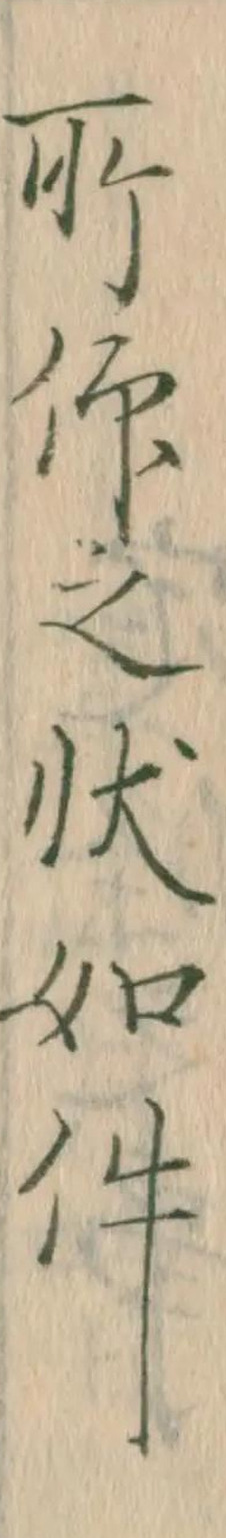所仰之状如件
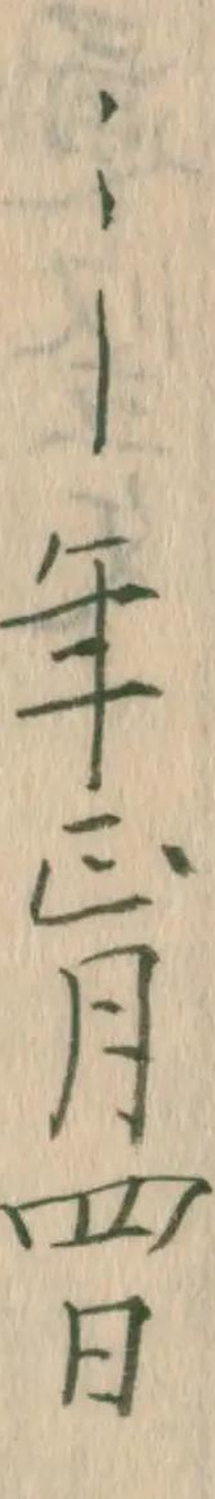ー―年正月四日
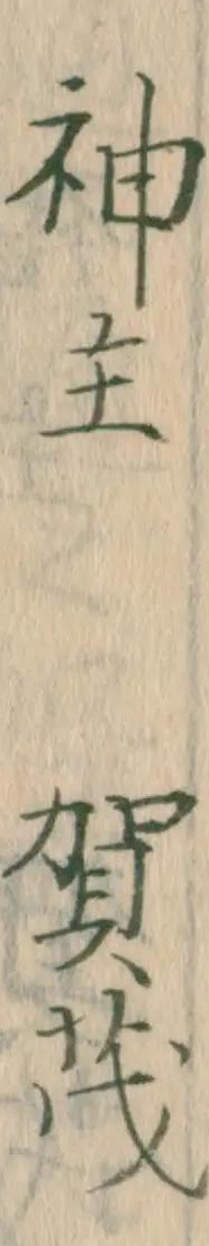神主賀茂
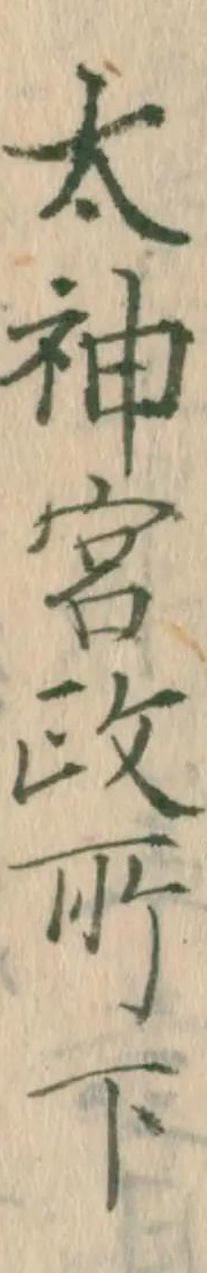太神宮政所下
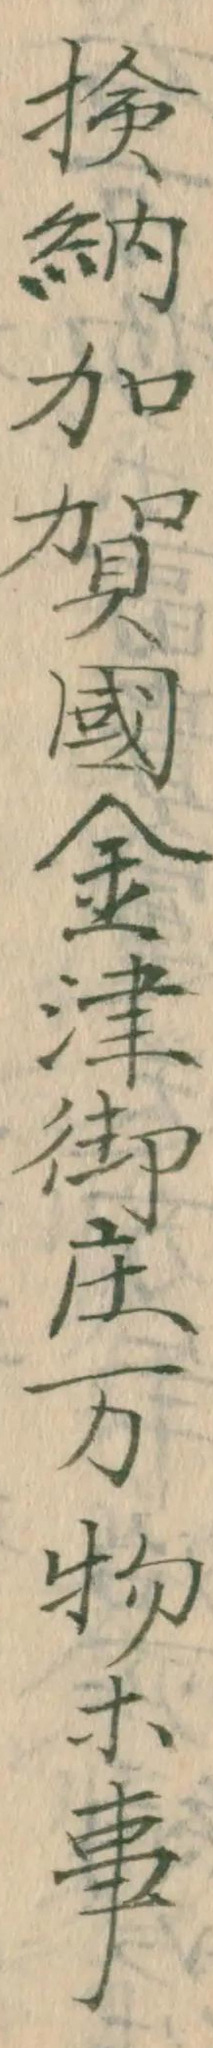検納加賀国金津御庄万物等事
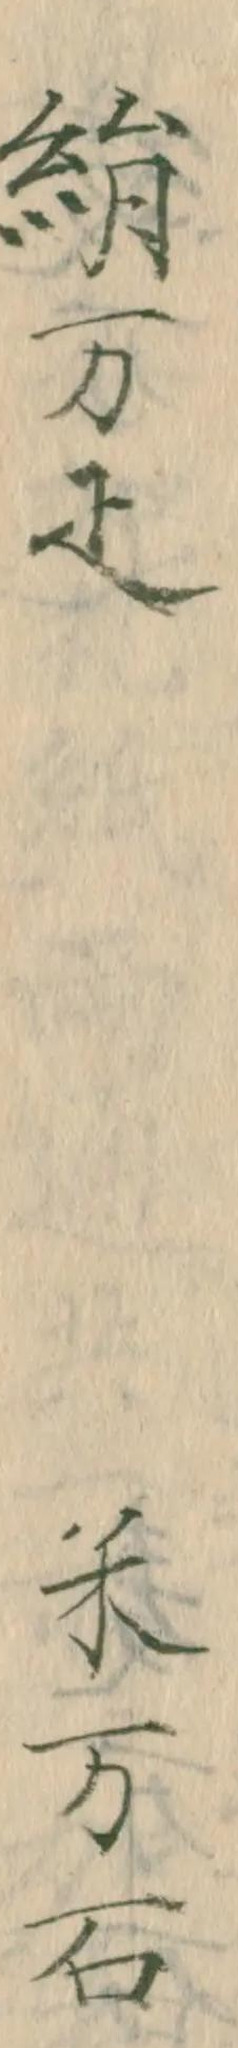絹万疋米万石
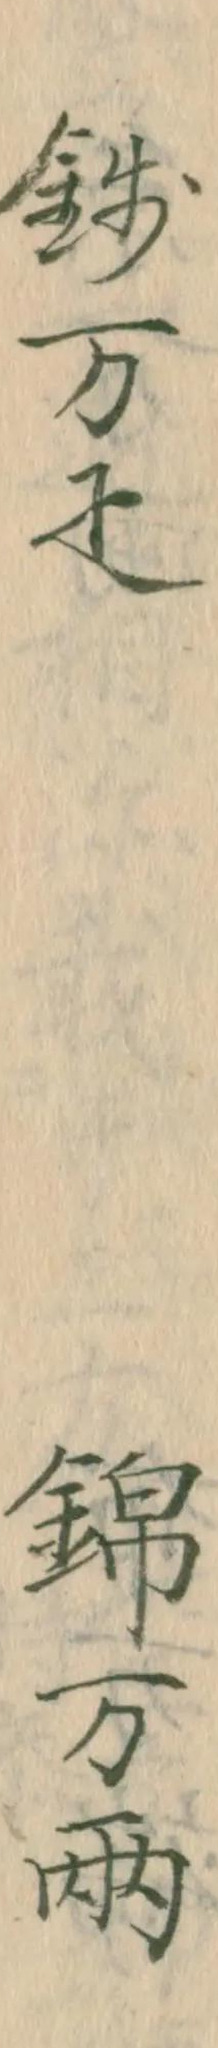銭万疋錦万両

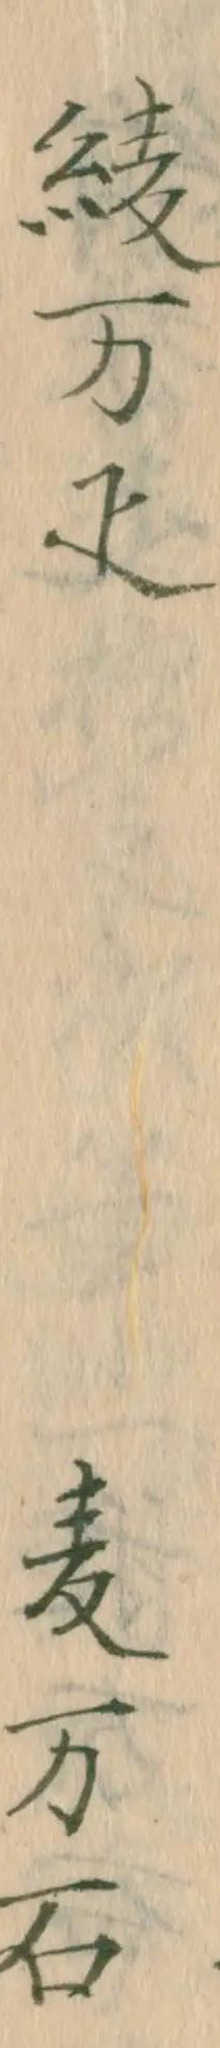綾万疋麦万石
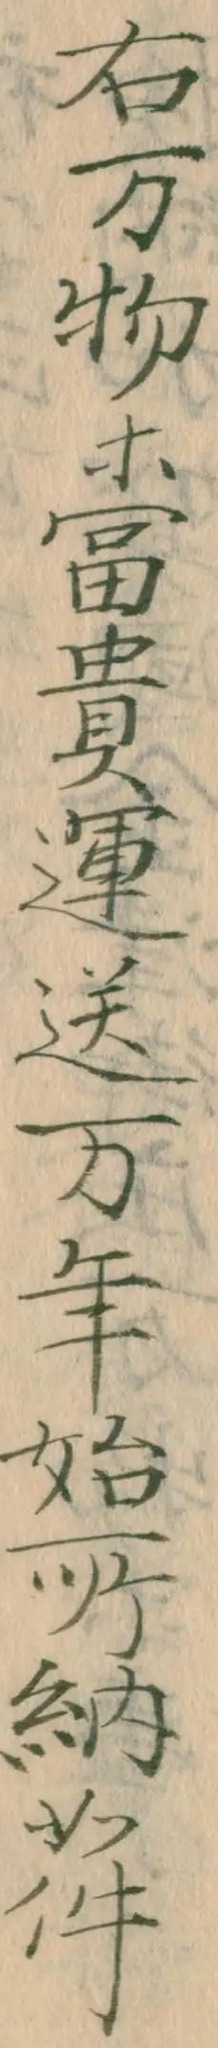右万物等富貴運送万年始所納如件
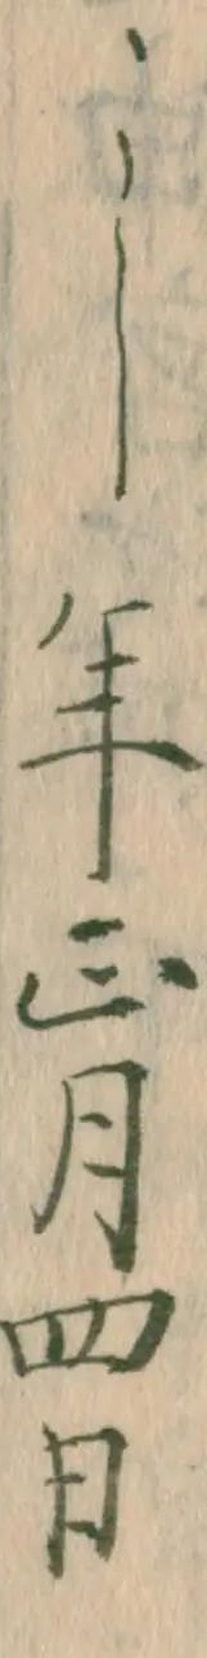―ーー年正月四日
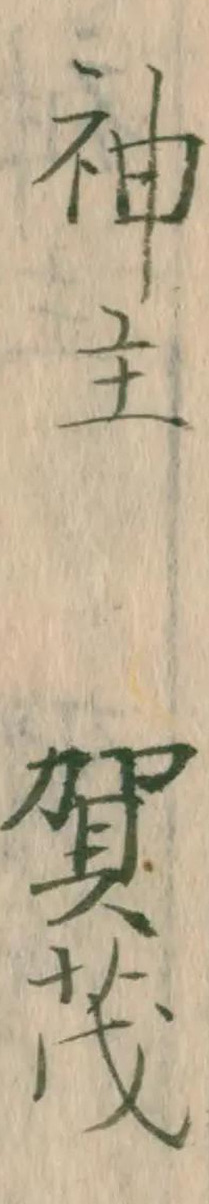神主賀茂
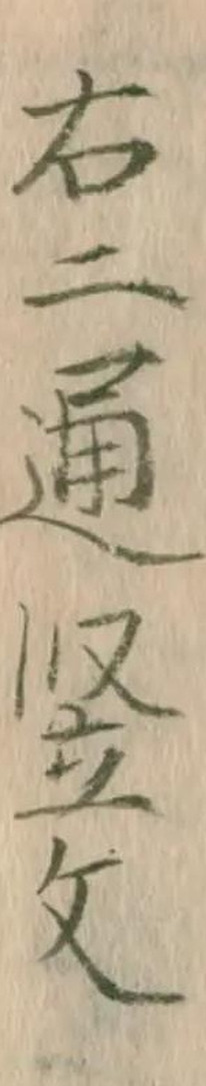右二通竪文
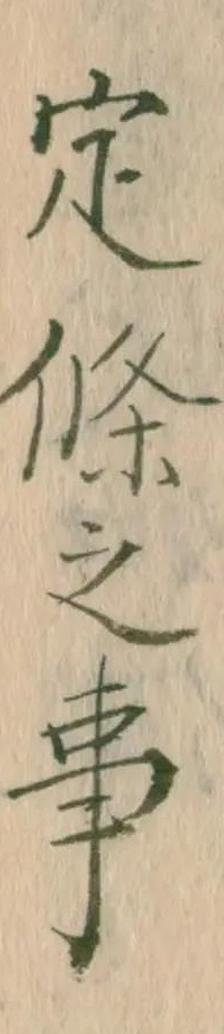定條之事
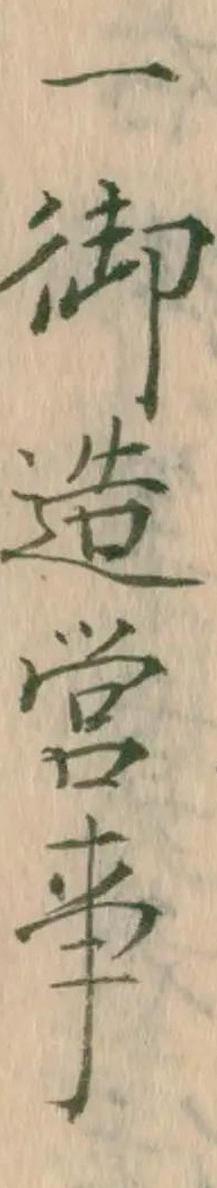一御造営事
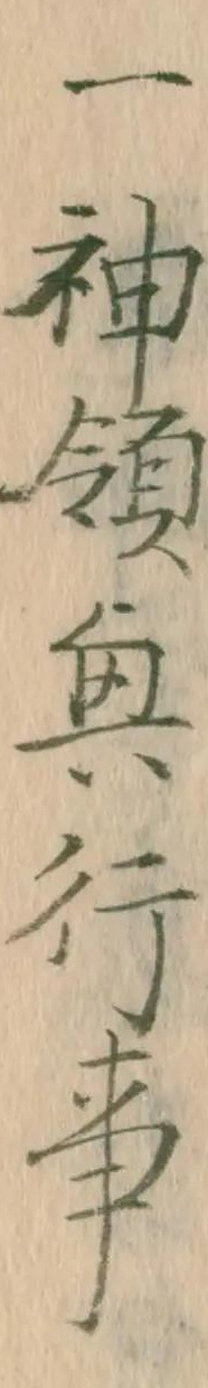一神領興行事
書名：賀茂社記録. 第26冊
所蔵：国立国会図書館 National Diet Library, JAPAN
